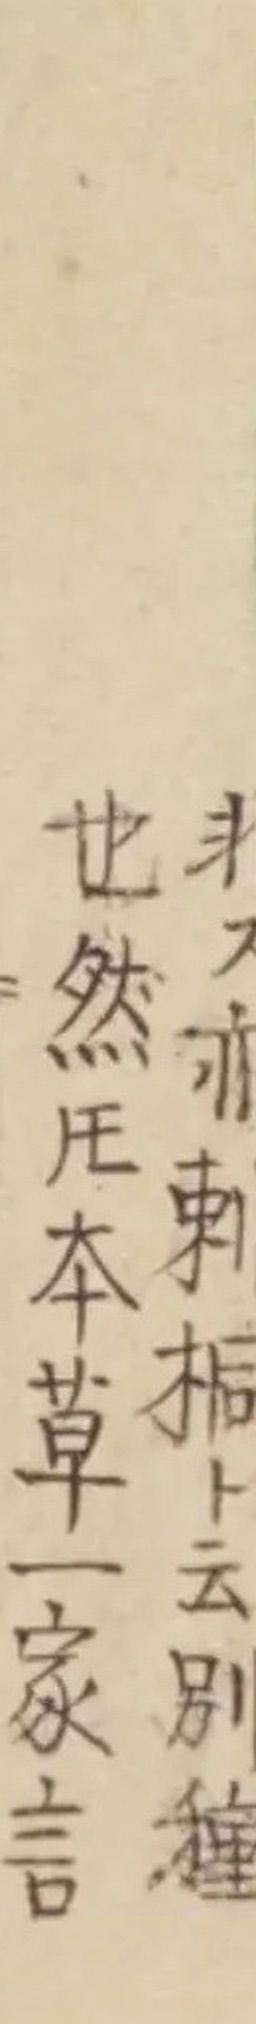也然共本草一家言
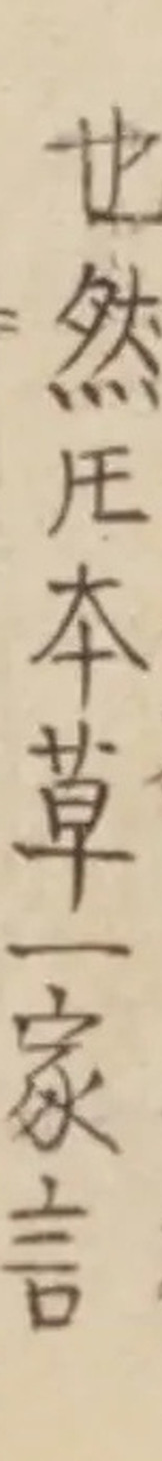也然共本草一家言
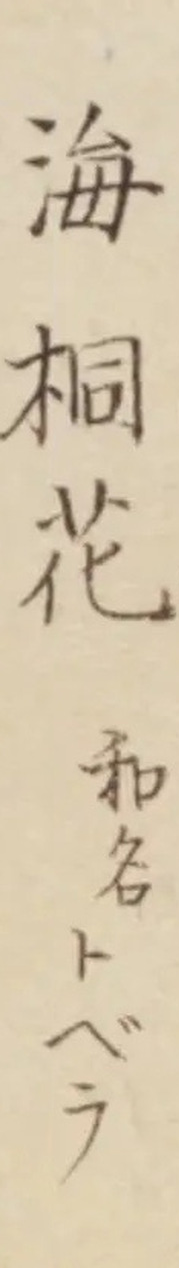海桐花和名とべら
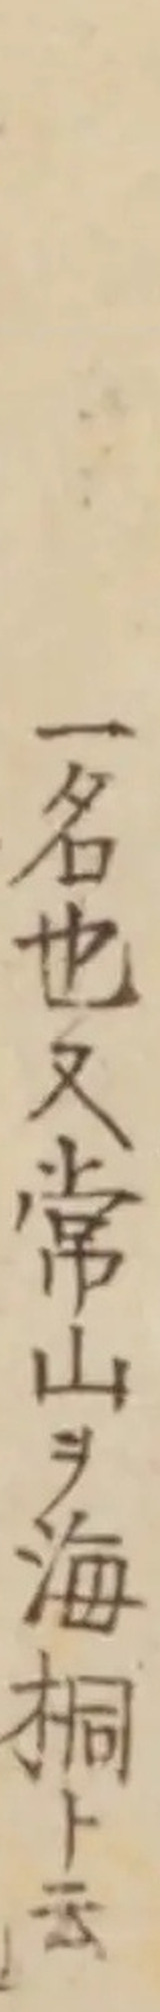一名也又常山を海桐と云
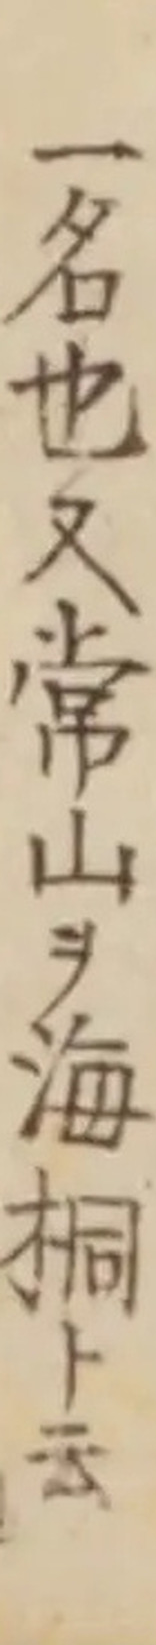一名也又常山を海桐と云

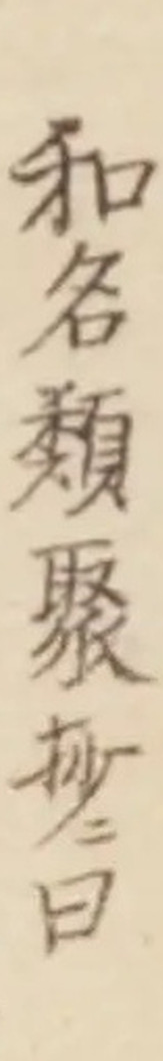和名類聚抄ニ曰
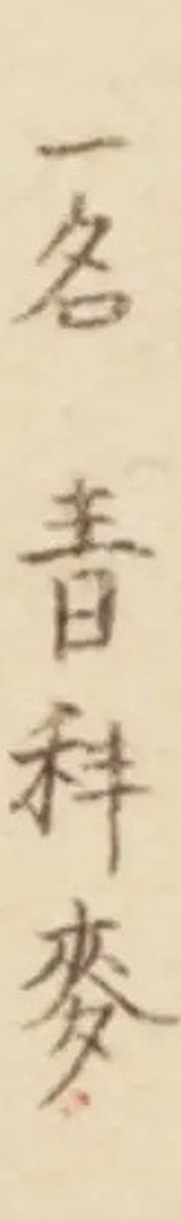一名青科麥
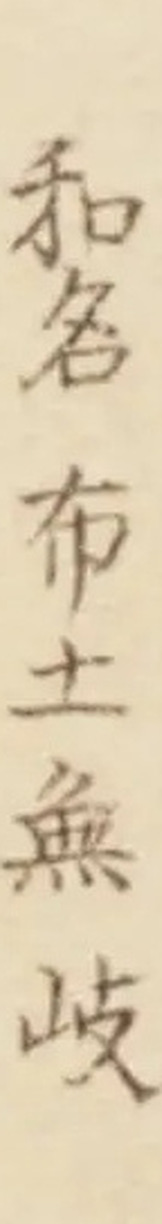和名布土無岐
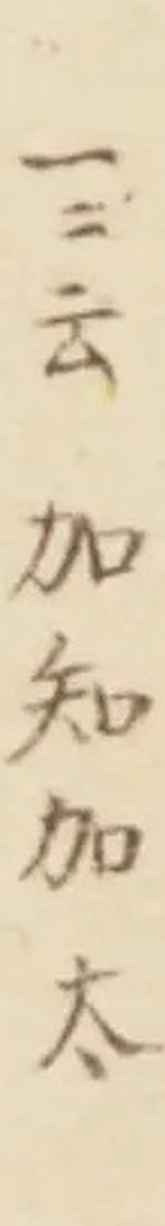一に云加知加太
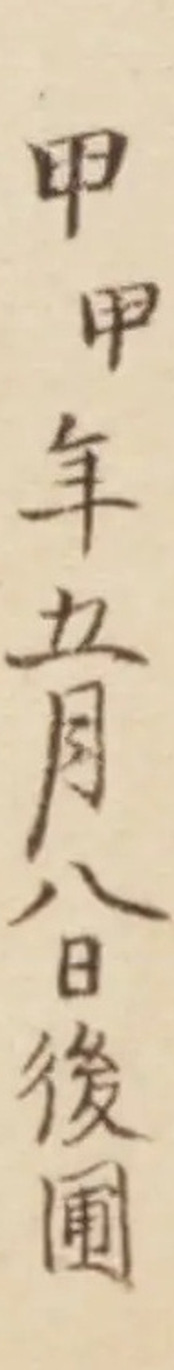甲申五月八日後園
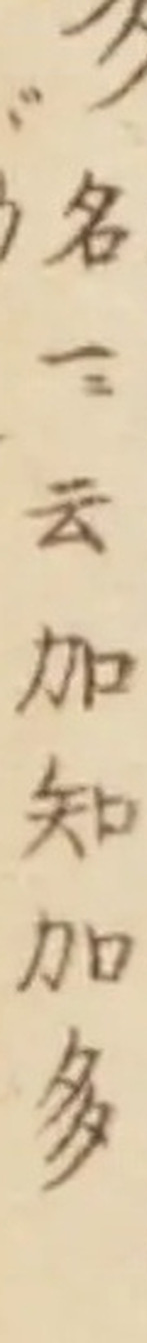名一に云加知加太
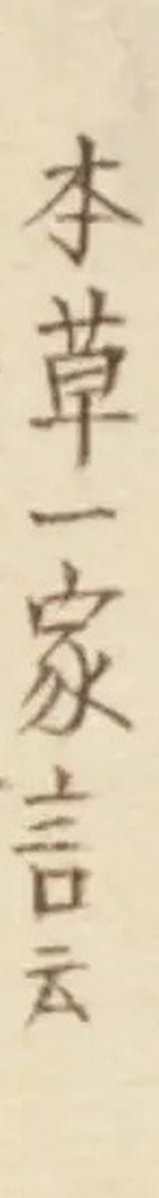本草一家言云
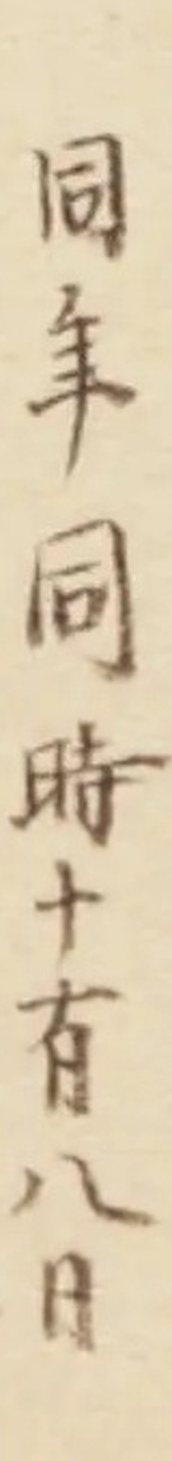同年同時十有八日

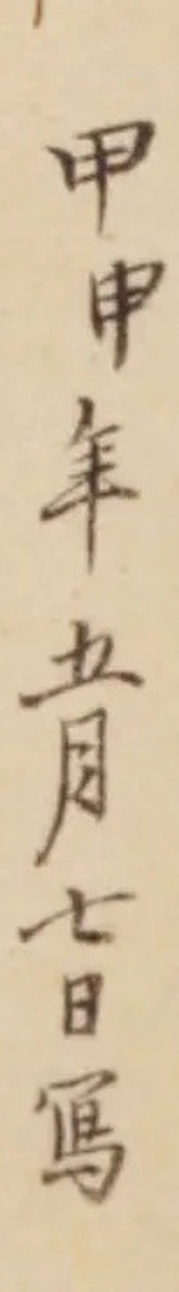甲申年五月十有七日
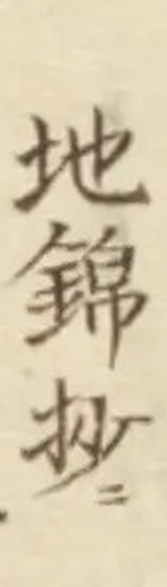地錦抄に
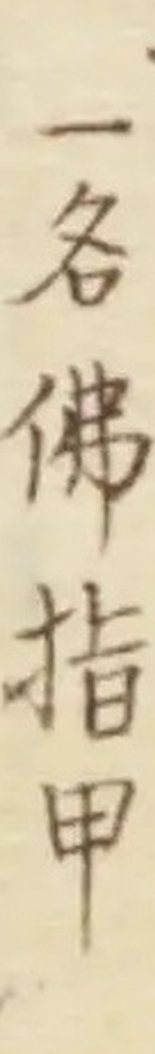一名佛指甲
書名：梅園草木花譜夏之部. 2
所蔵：国立国会図書館 National Diet Library, JAPAN
